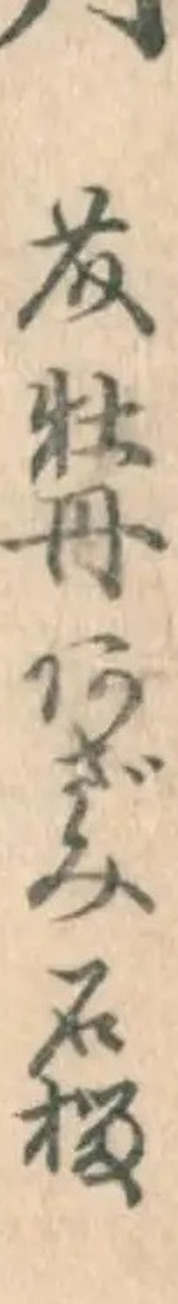四月藤牡丹あざみ石榴
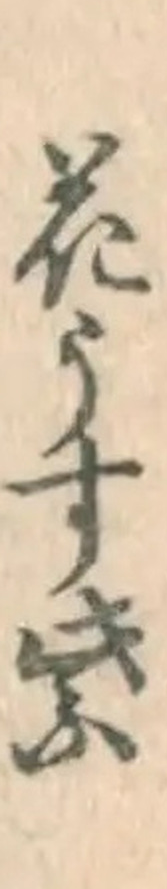花うす紫
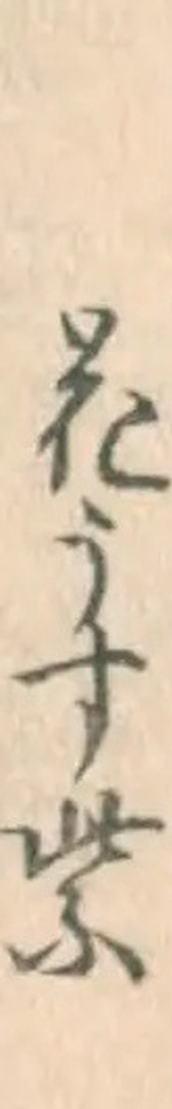花うす紫
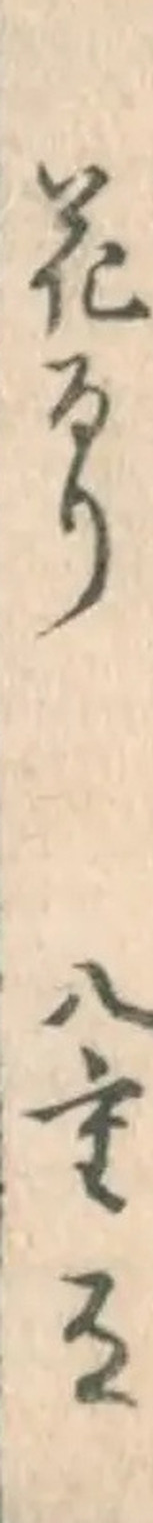花なり八重有
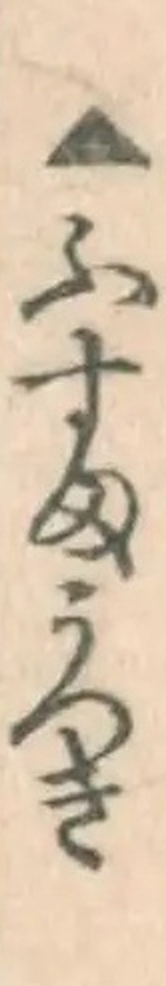▲ふすまうつき
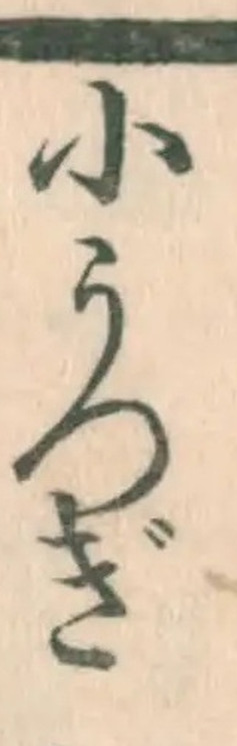小うつぎ
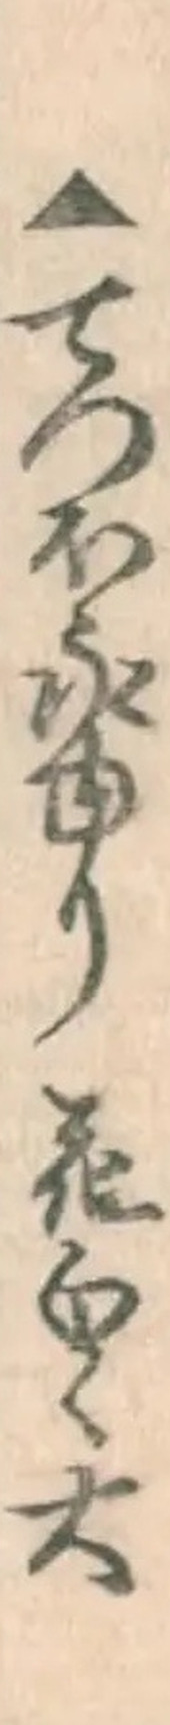▲てつほうゆり花白く大
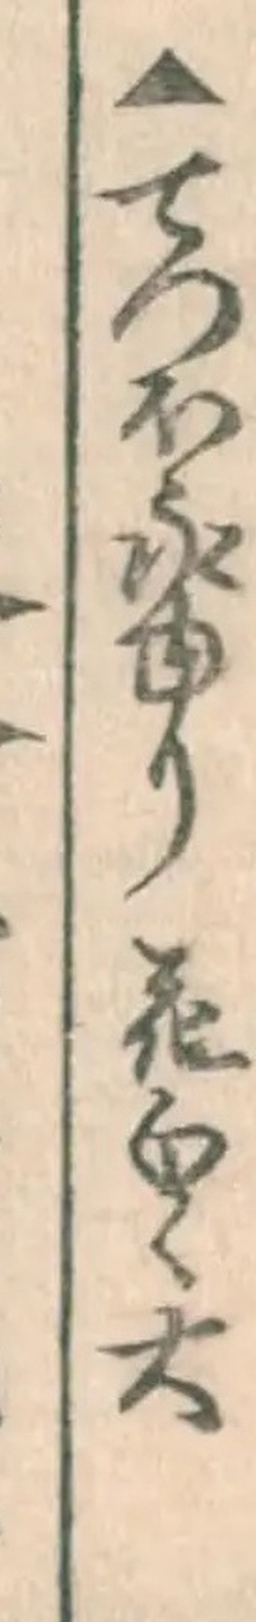▲てつほうゆり花白く大
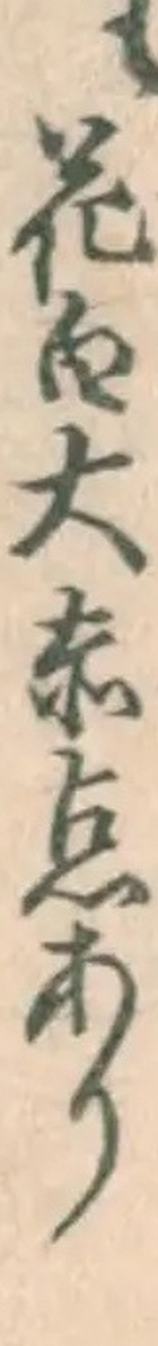花白大赤点あり
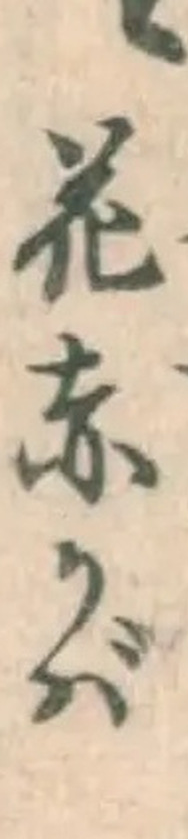花赤かバ
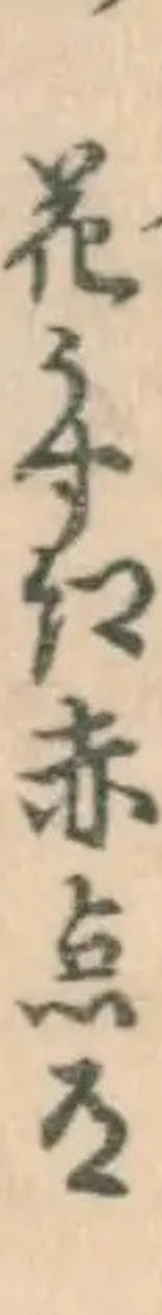花うす紅赤点々
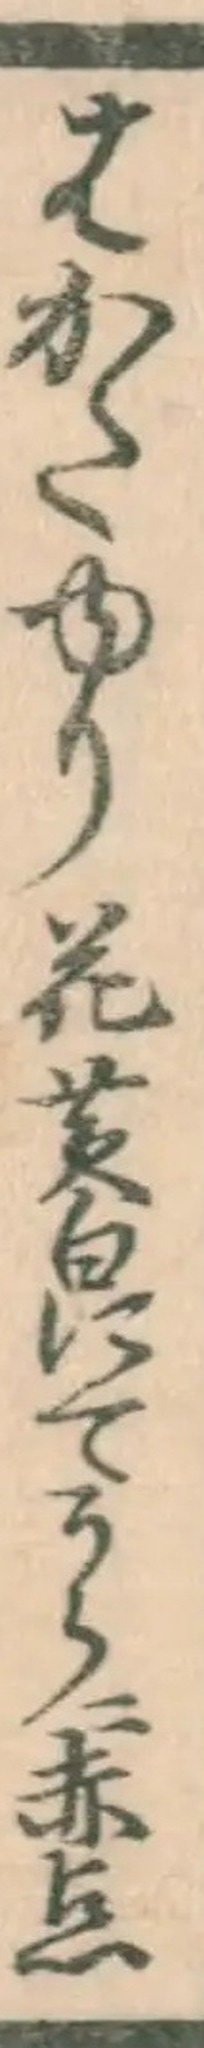はかたゆり花黄白にてうら二赤点
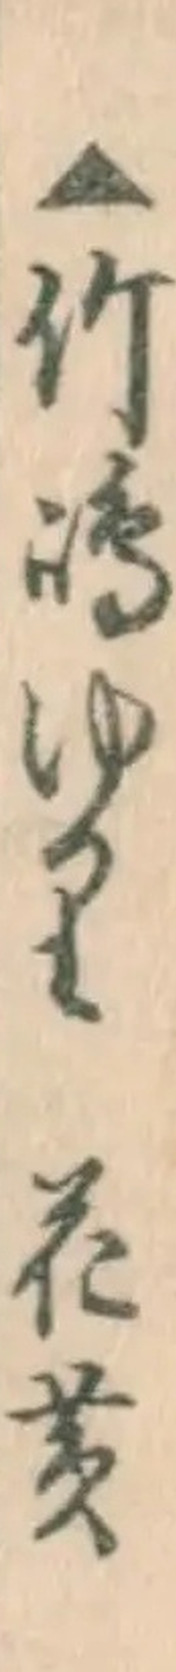▲竹嶋ゆり花黄
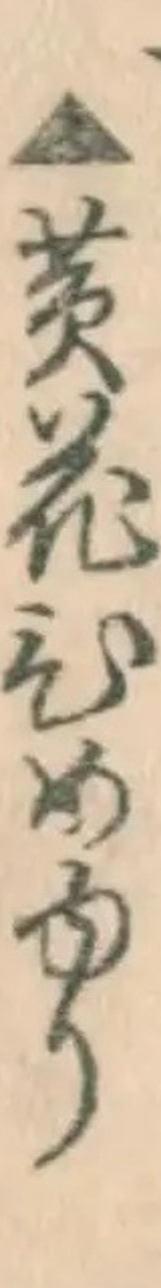▲黄花ひめゆり
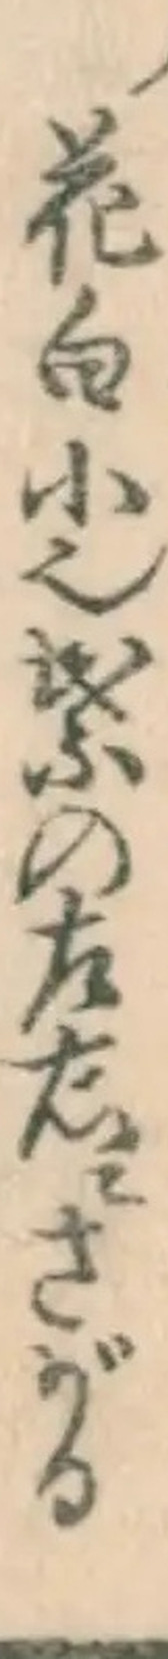花白小也葉の左にさがる
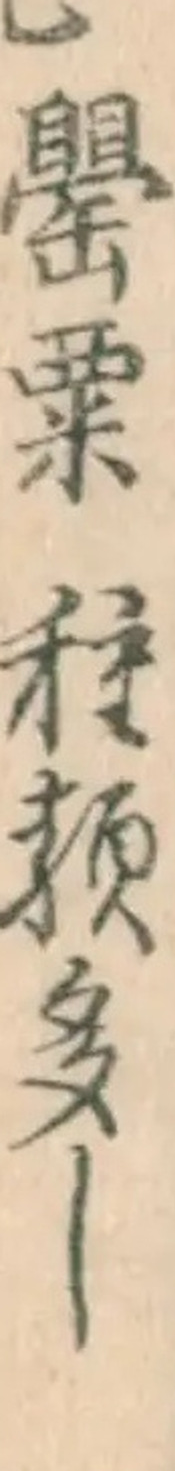百合種類多し
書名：茶席挿花集
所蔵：国立国会図書館 National Diet Library, JAPAN
